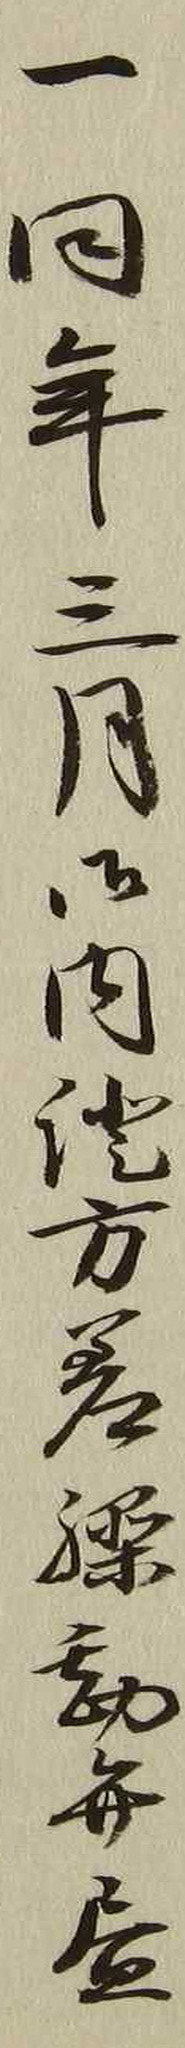一同年三月御内証方差繰勘弁昼
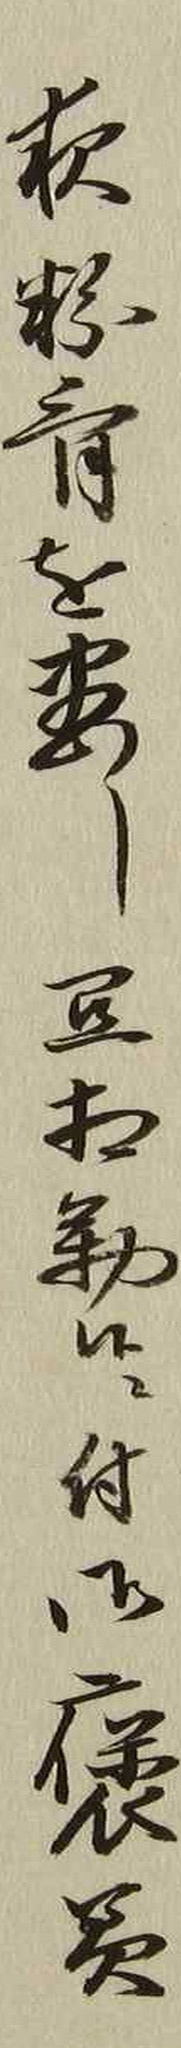夜粉骨を尽し宜相勤候ニ付御褒美
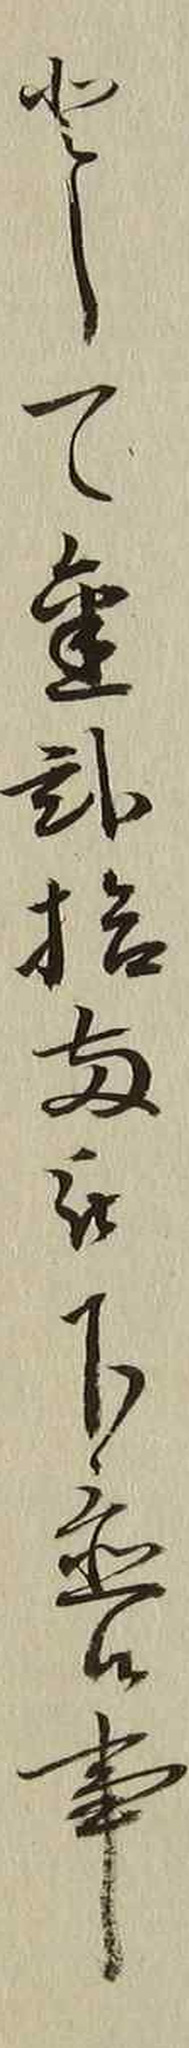として金弐拾両被下置候事
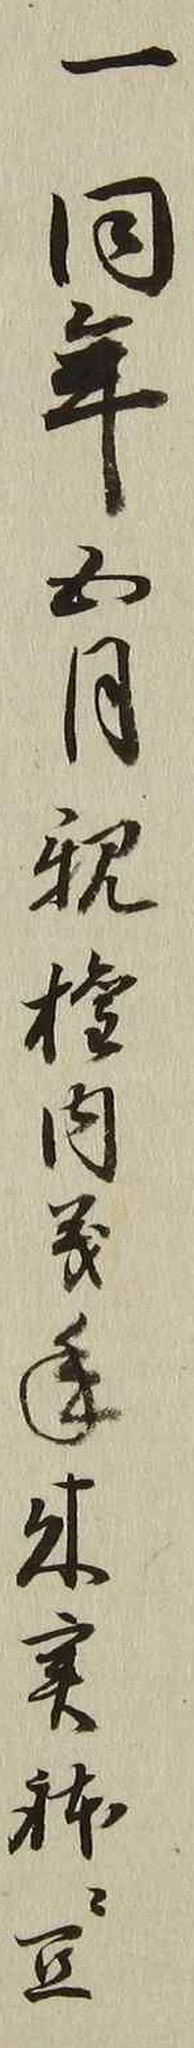一同年五月親権内義年来実体ニ宜
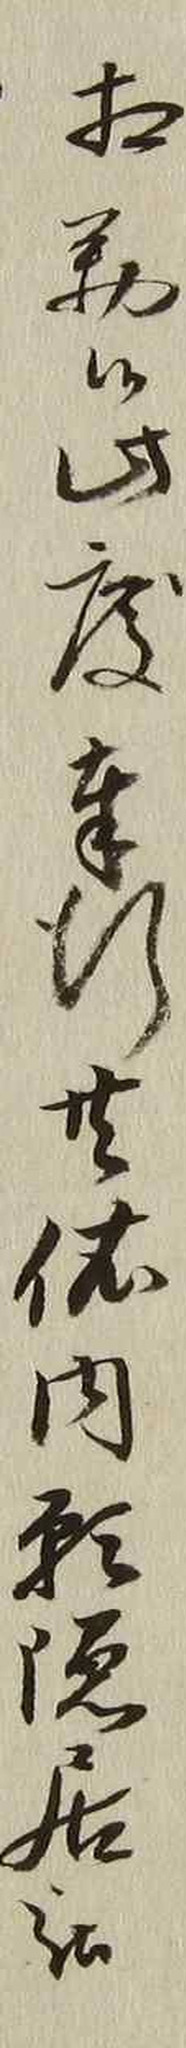相勤候此度奉行共依内願隠居被
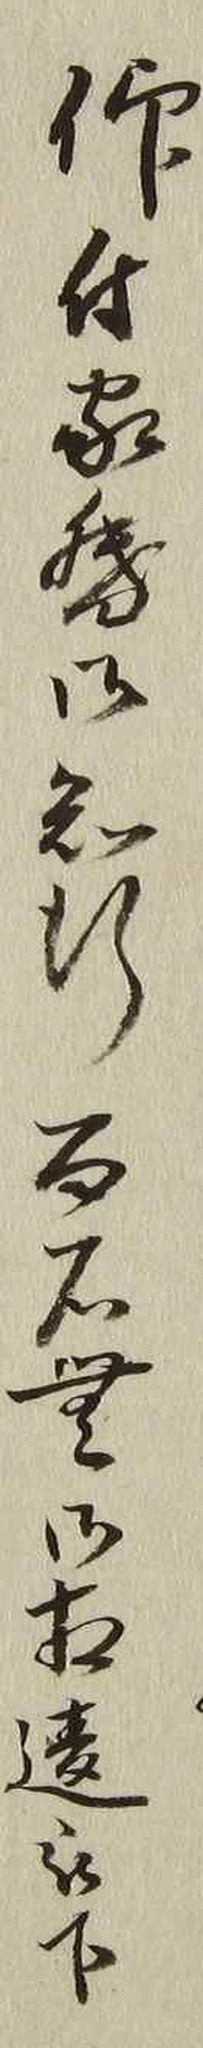仰付家督御知行百石無御相違被下
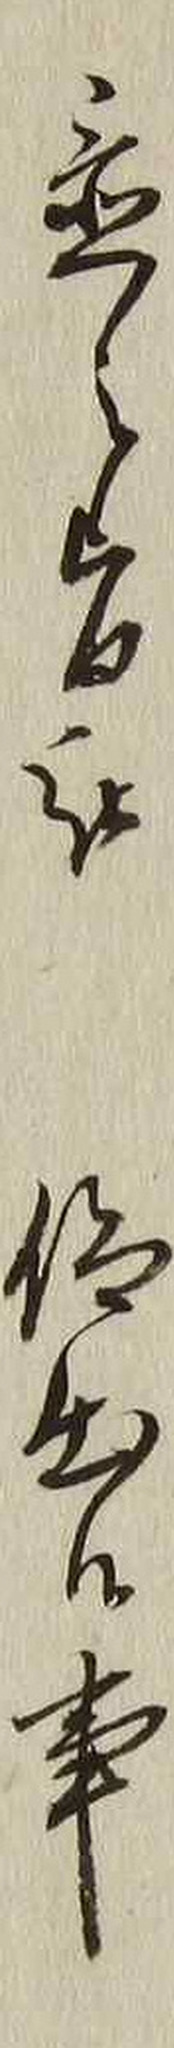置候旨被仰出候事
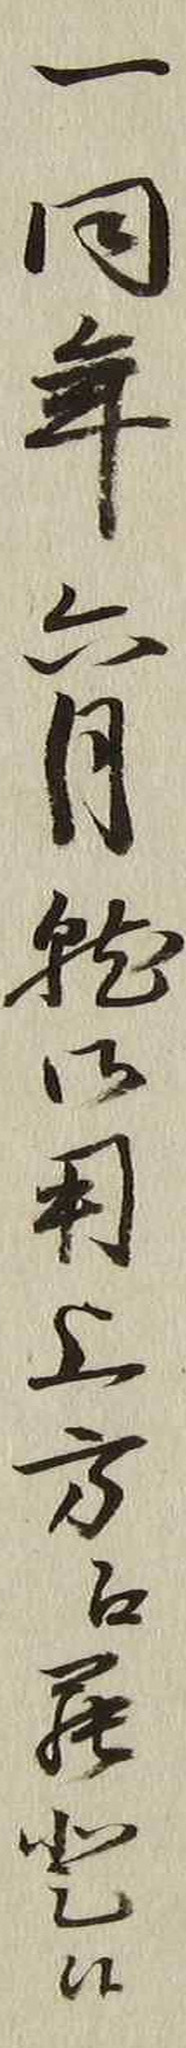一同年六月就御用上方江罷登候
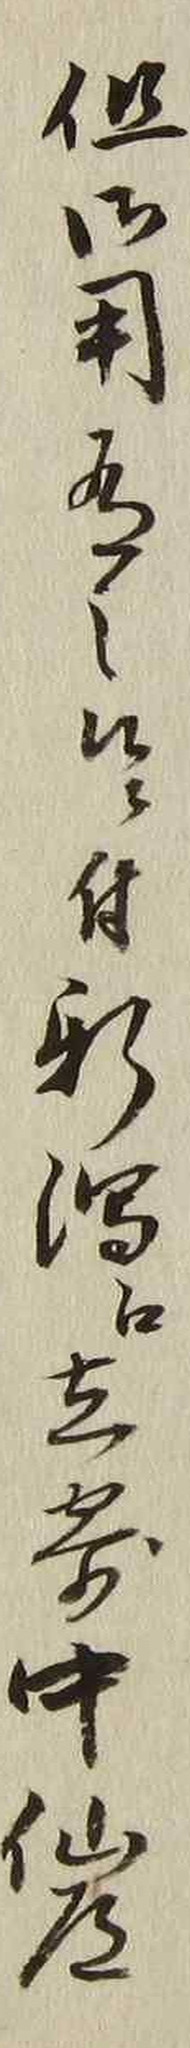但御用有之候ニ付新潟江立寄中仙道
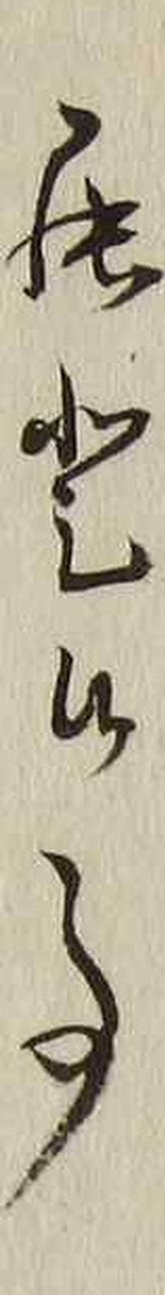罷登候事
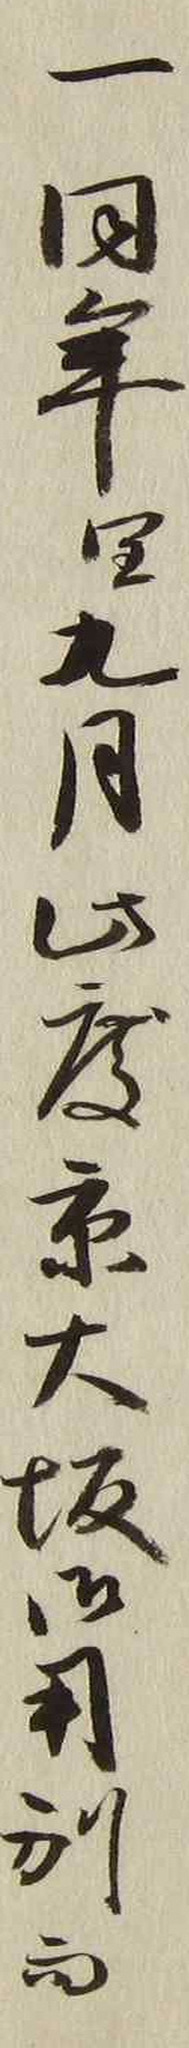一同年閏九月此度京大坂御用別而
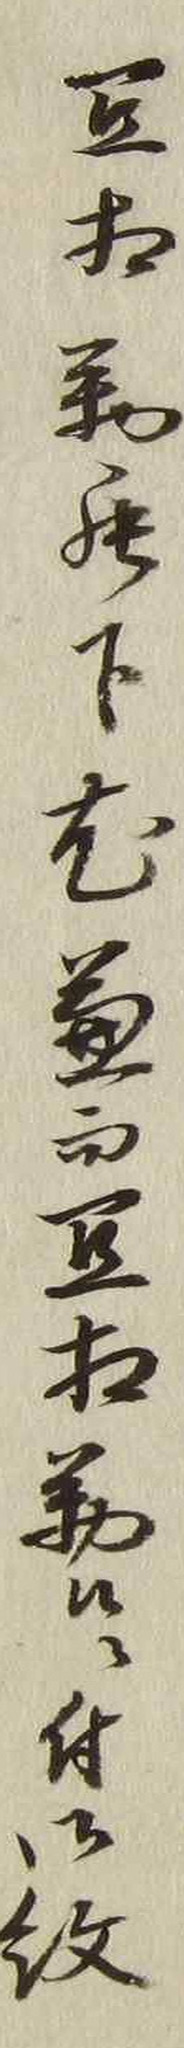宜相勤罷下尤兼而宜相勤候ニ付御紋
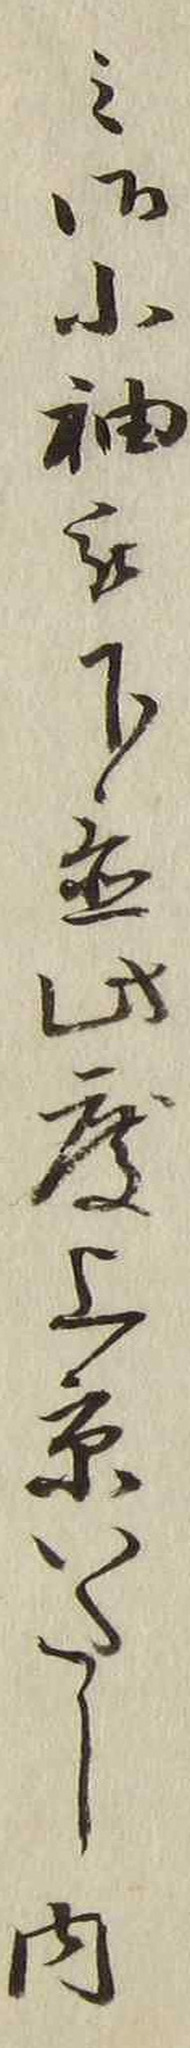之御小袖被下置此度上京いたし内

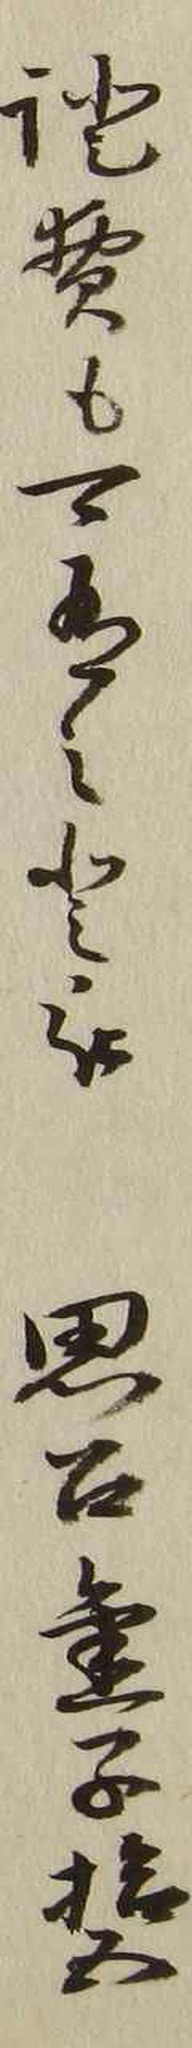証費も可有之と被思召金子拾五
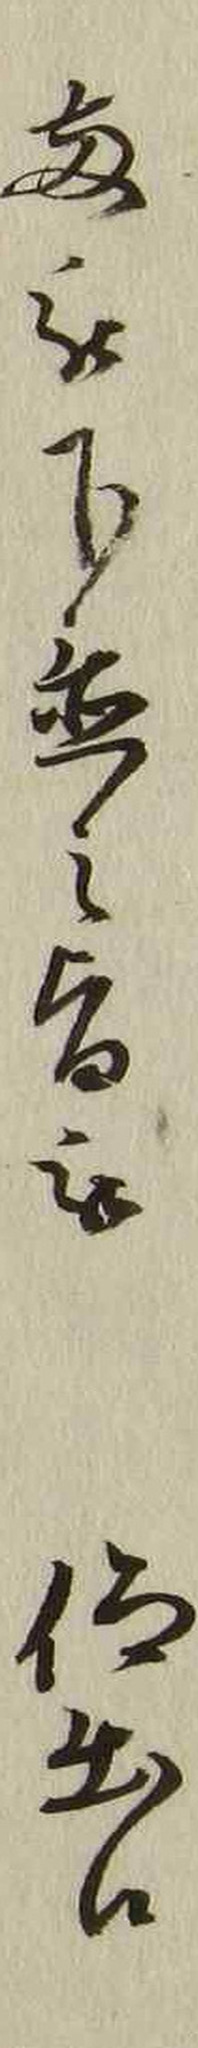両被下置之旨被仰出候
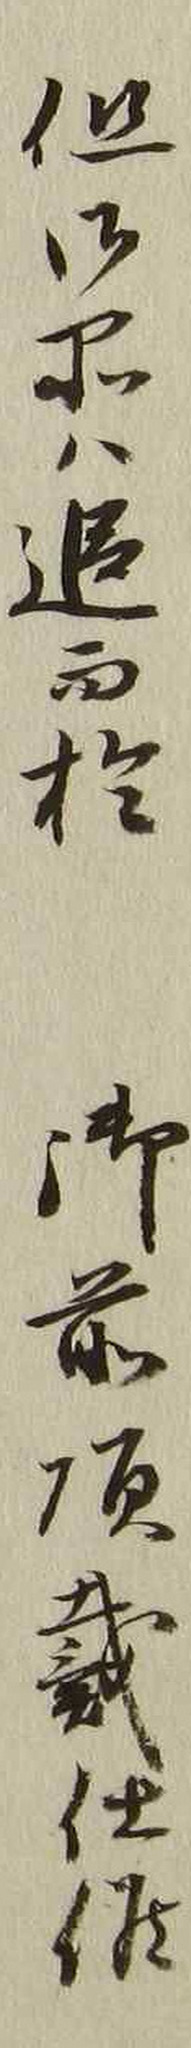但御品ハ追而於御前頂戴仕候
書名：諸士系譜　巻之61　と之部4
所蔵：会津若松市立会津図書館
